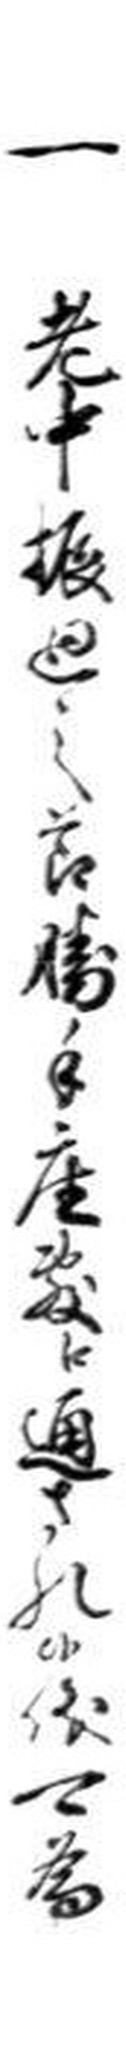一老中振廻之節勝手座敷江通され候儀可為
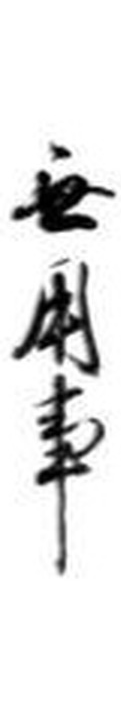無用事
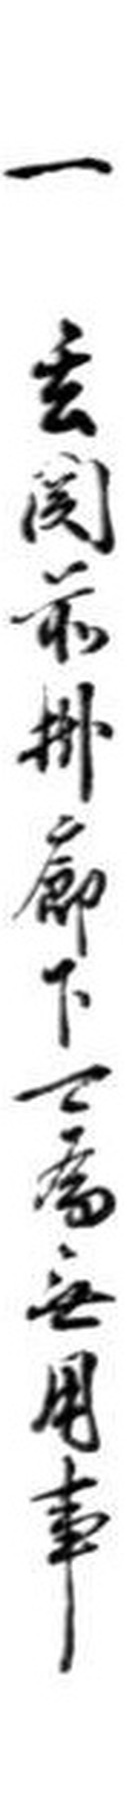一玄関前掛廊下可為無用事
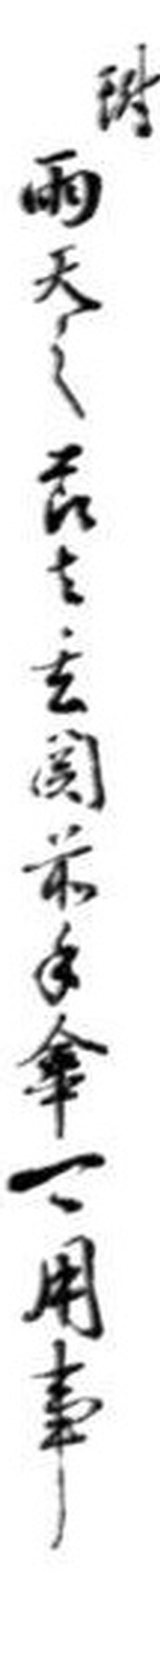雨天之節者玄関前手傘可用事
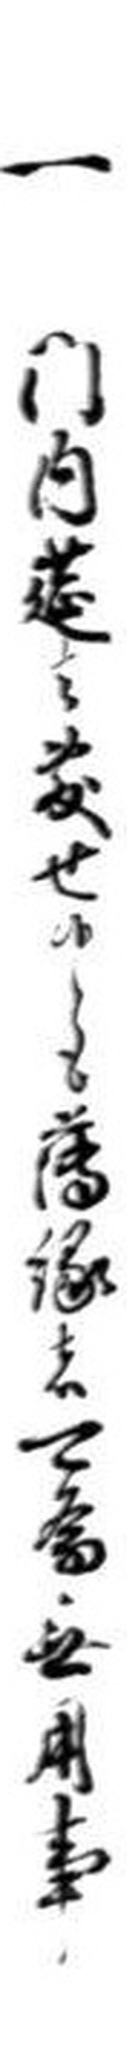一門内莚者敷せ候とも薄縁者可為無用事
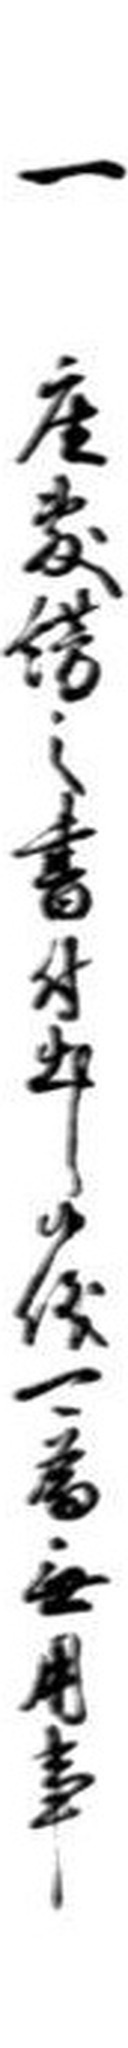一座敷飾之書付出し候儀可為無用事
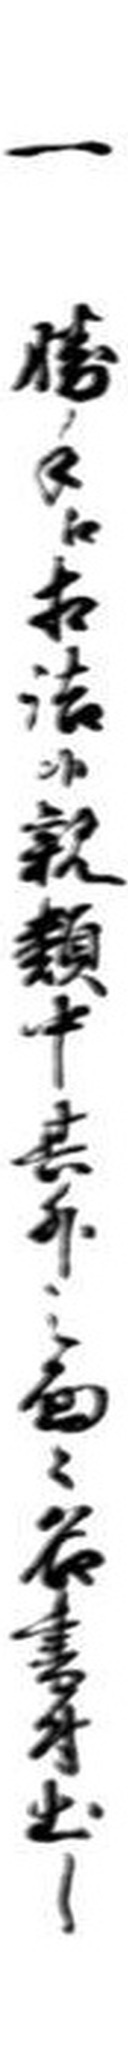一勝手江相詰候親類中其外之面々名書付出し
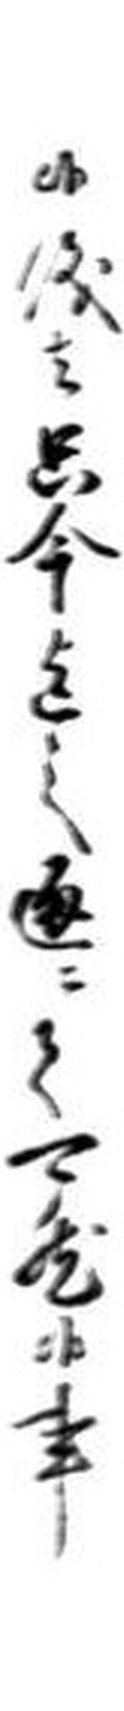候儀者只今迄之通にて可然候事
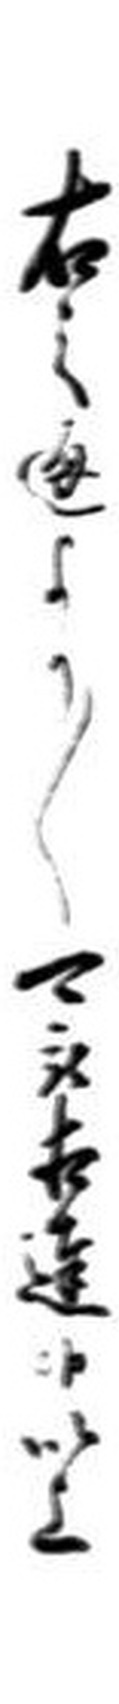右之通より〳〵可被相達候以上
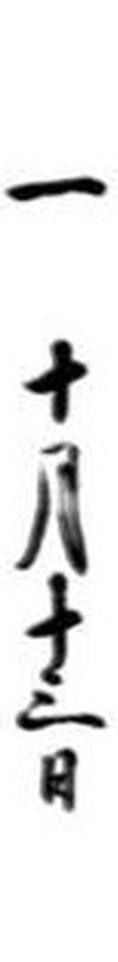一十月十三日
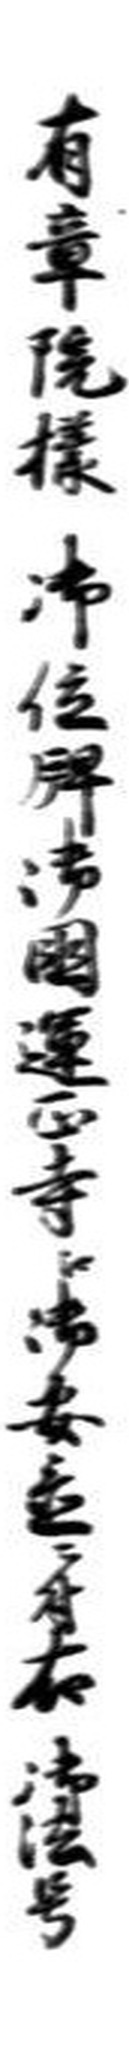有章院様御位牌御国運正寺江御安置ニ付右御法号
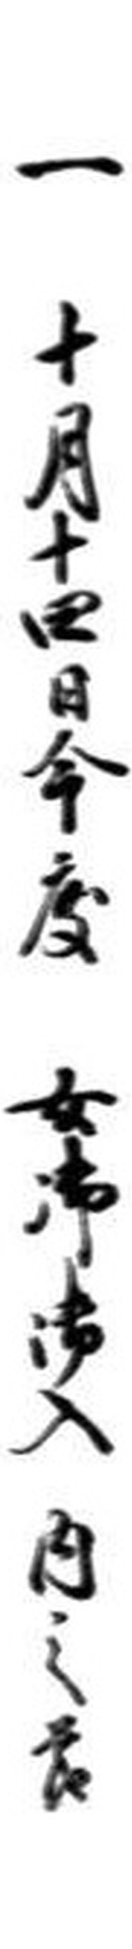一十月十四日今度女御御入内之節

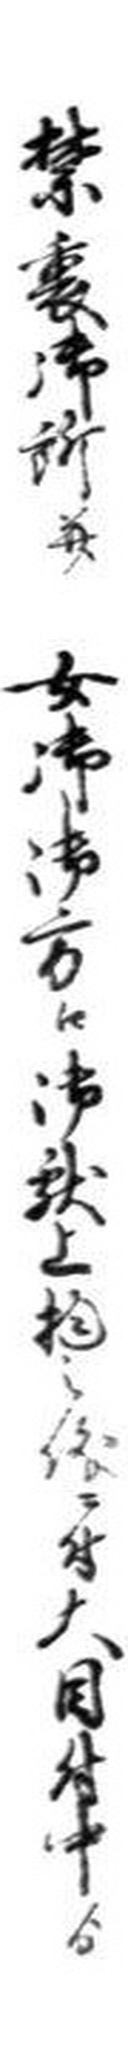禁裏御所并女御御方江御献上物之儀ニ付大目付中ゟ
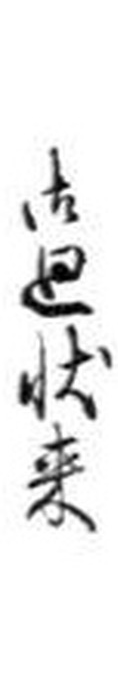御廻状来
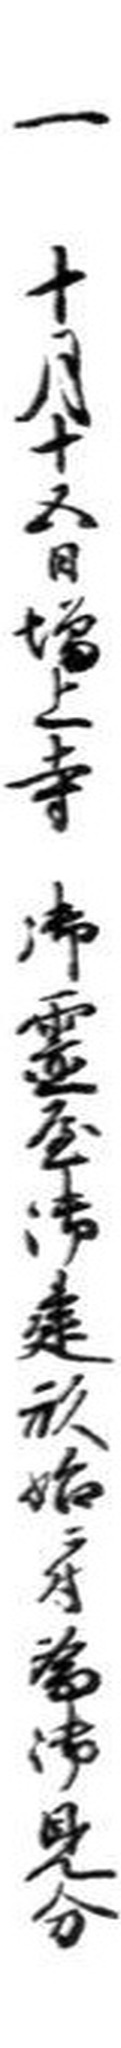一十月十五日増上寺御霊屋御建形始ニ付為御見分
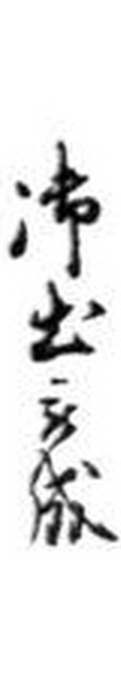御出被成
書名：家譜 三十一 吉邦公 享保元年
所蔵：福井県文書館 Fukui Prefectural Archives
